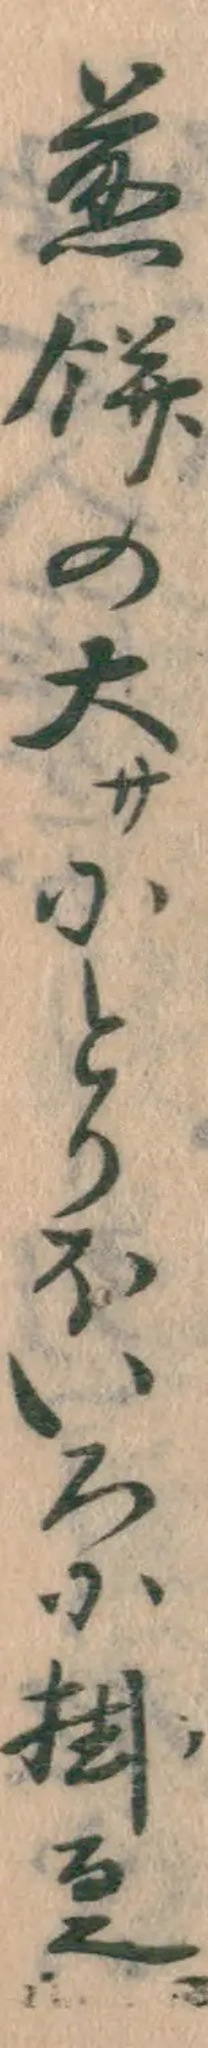煎餅の大さにとりほいろに掛る也
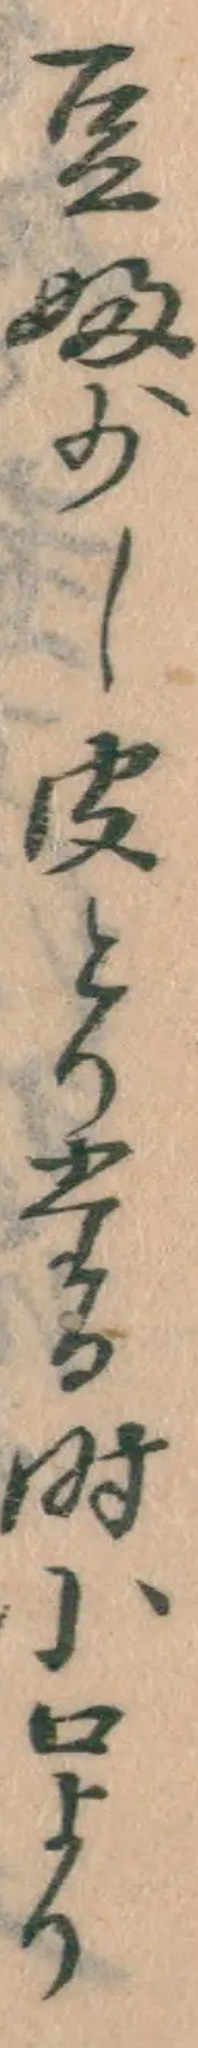豆ふ少し皮とりたる時小口より
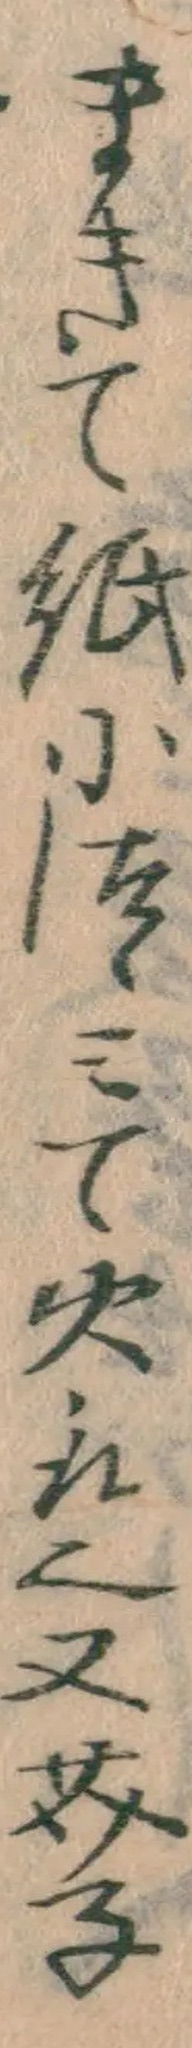まきて紙につゝみて火取也又芥子
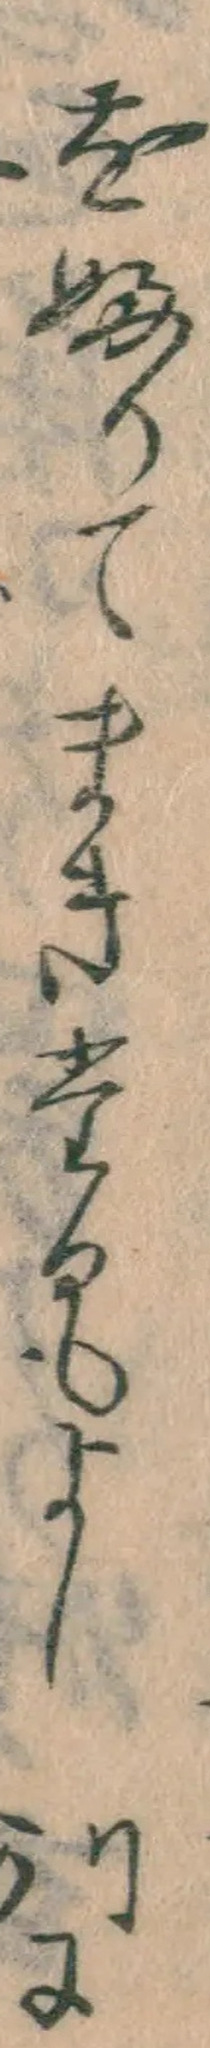をふりてまきたるもよし別に
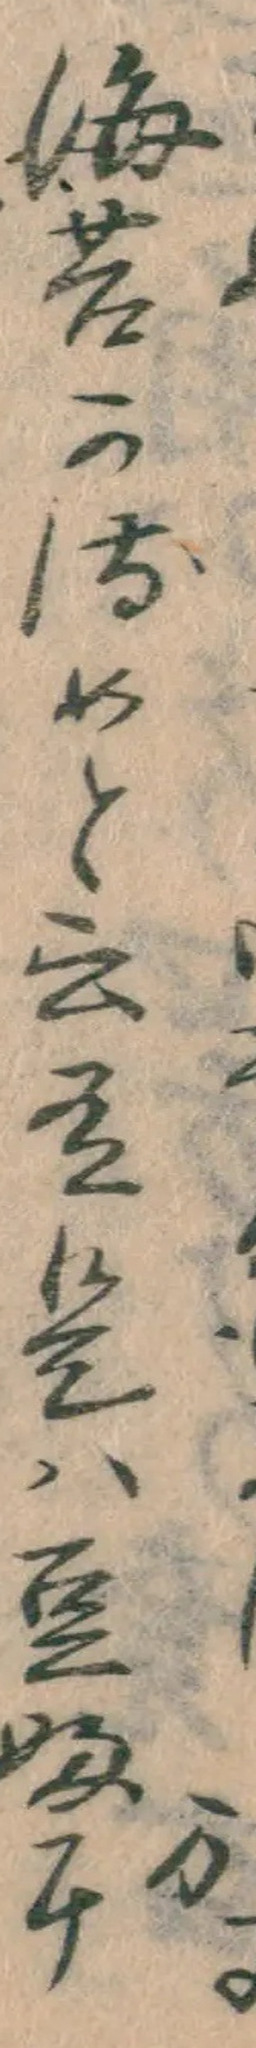海苔かるめと云有是は豆ふに
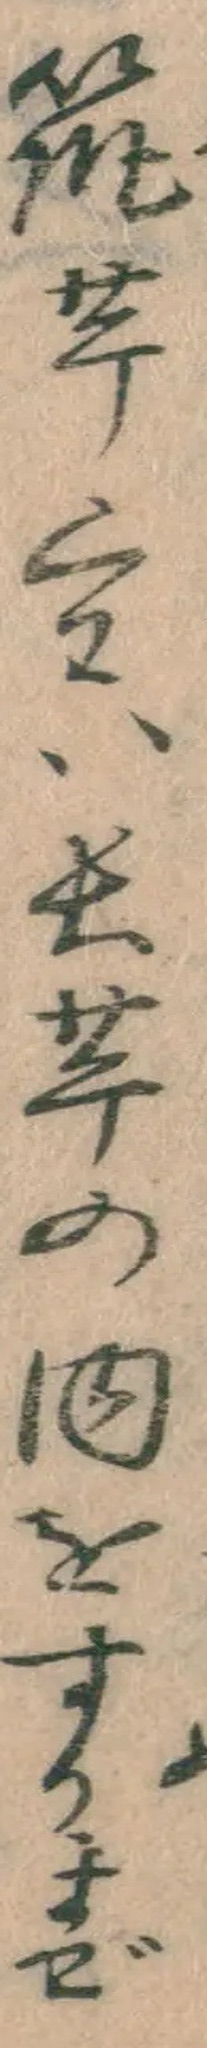筑芋くわい長芋の内をすりまぜ
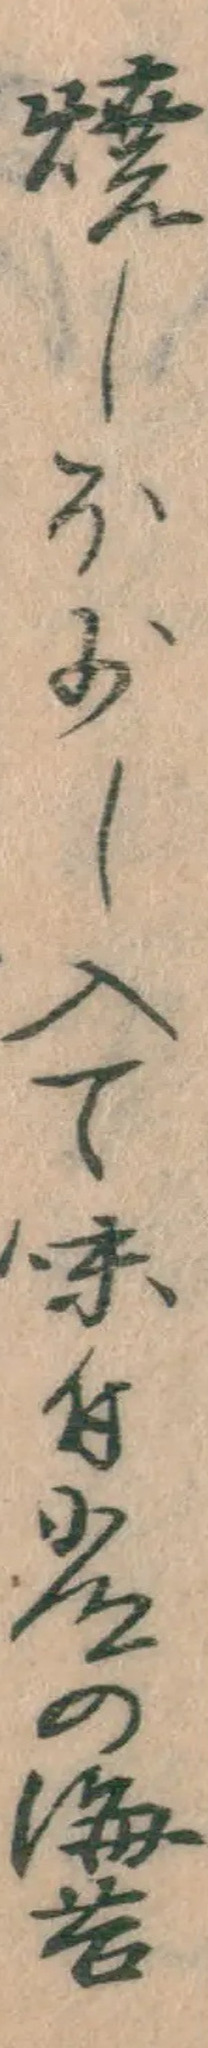焼しほ少し入て味付常の海苔
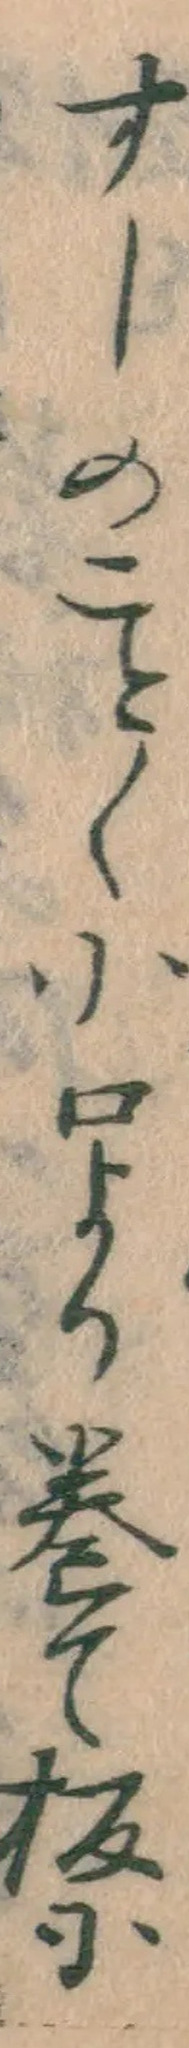すしのことく小口より巻て板に
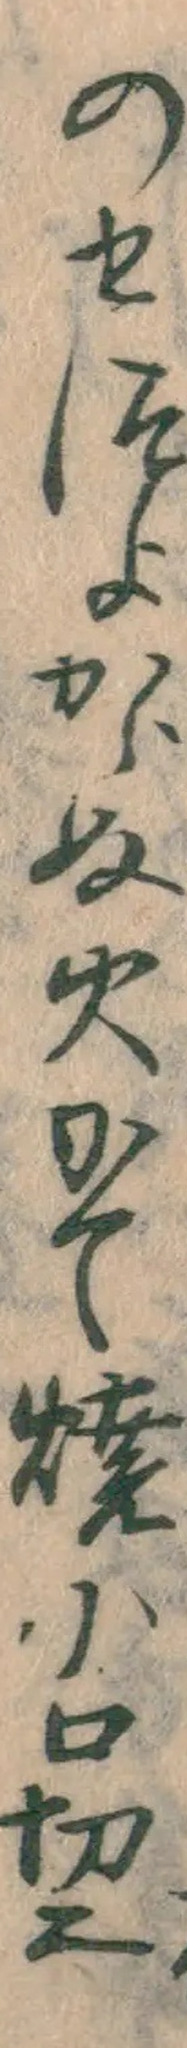のせつよからぬ火にて焼小口切也
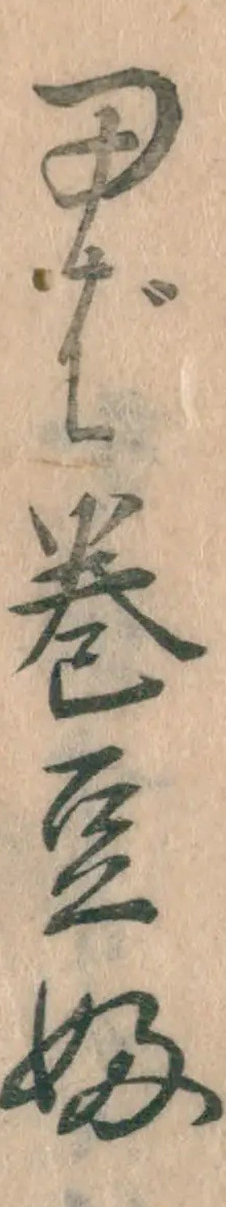ゆば巻豆ふ
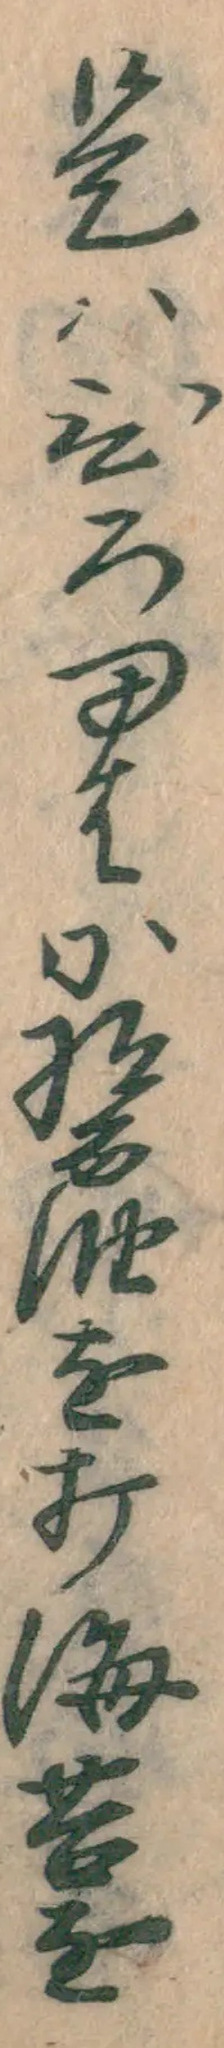是はひろゆはに醤油を打海苔を

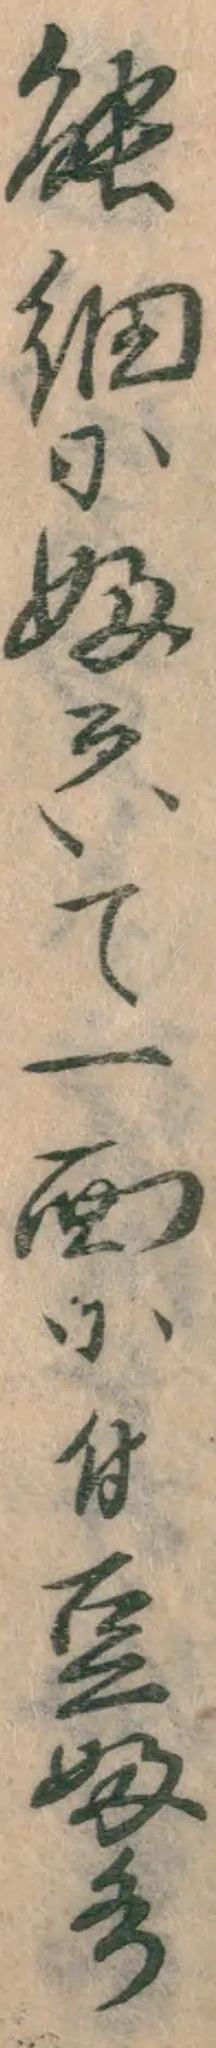能細にふるいて一面に付豆ふ水
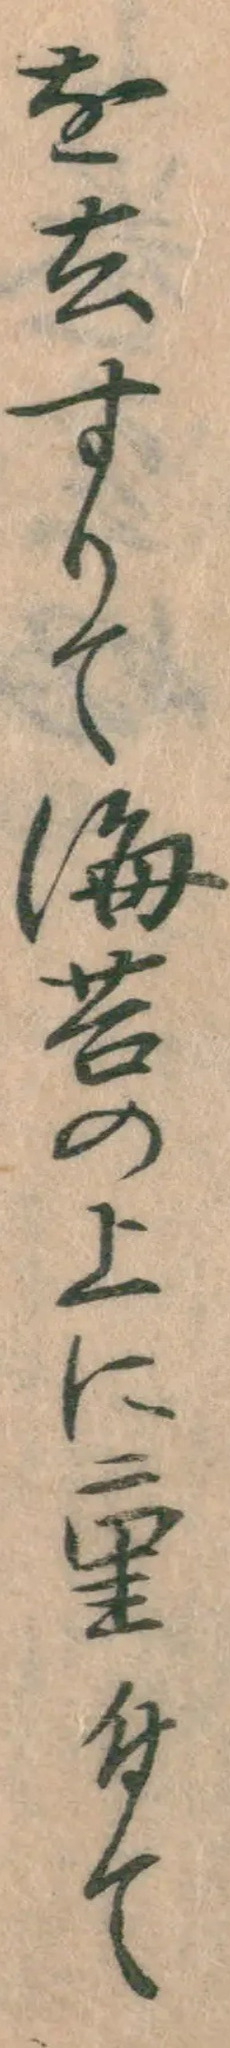を去すりて海苔の上に重付て
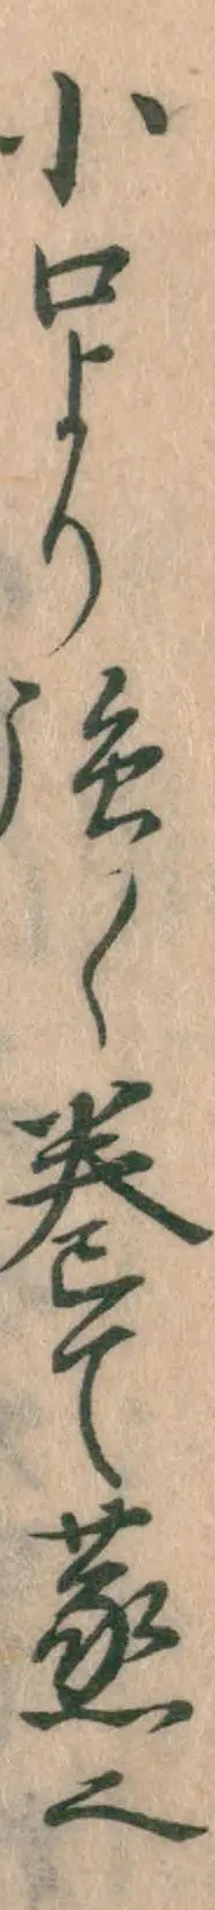小口より強く巻て蒸也
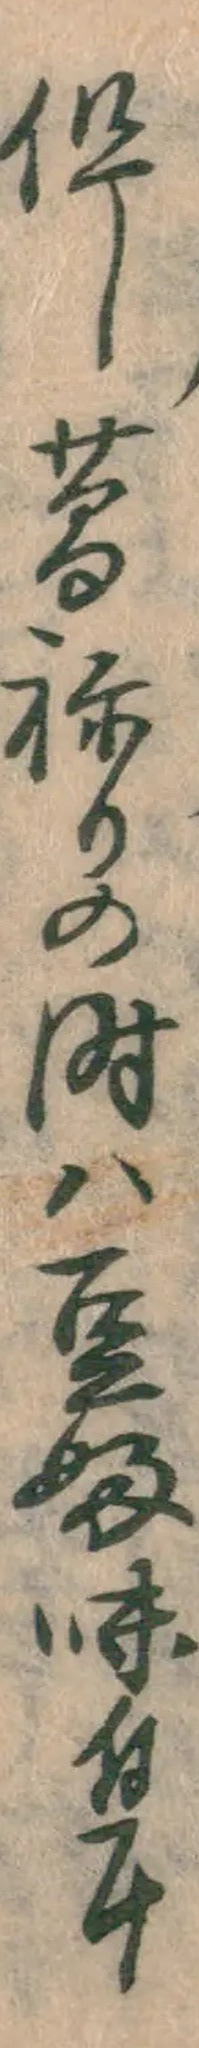但し葛ねりの時は豆ふ味付に
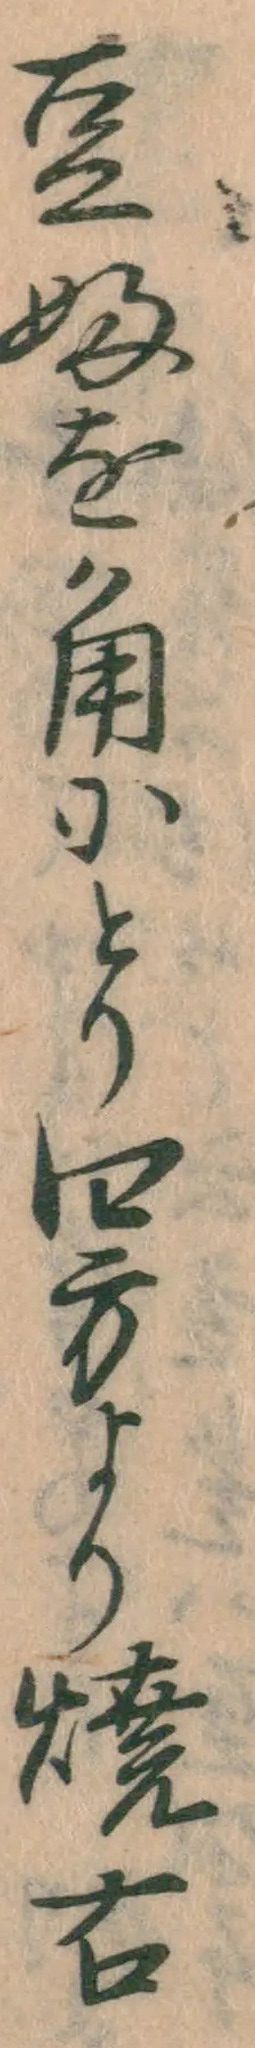豆ふを角にとり四方より焼古
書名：豆腐百珍余録
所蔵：国立国会図書館 National Diet Library, JAPAN
